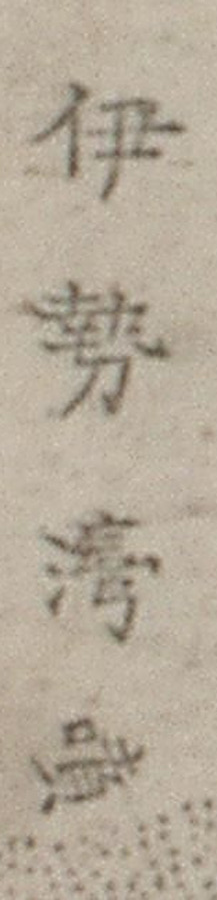伊勢湾

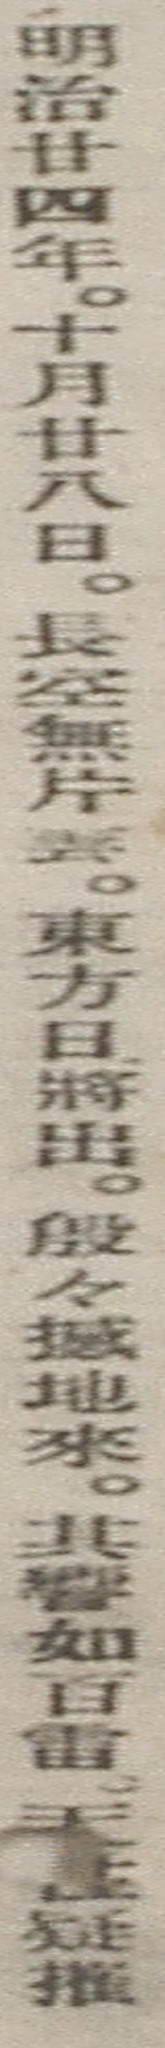明治廿四年。十月廿八日。長空無片雲。東方日将出。殷々撼地来。其響如百雷。天柱疑摧
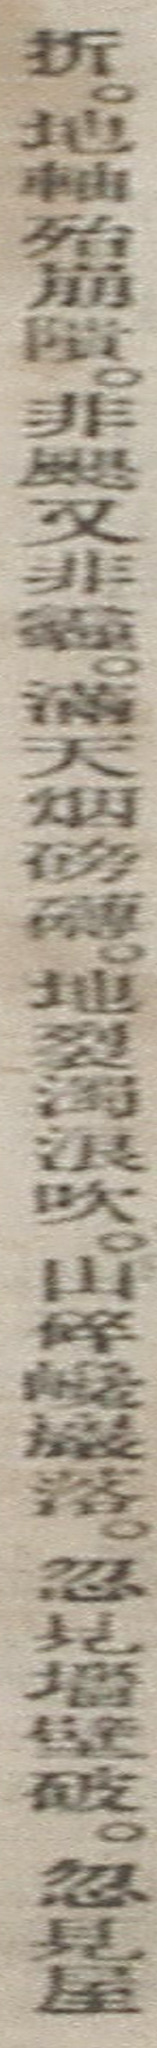折。地軸殆崩隤。非颶又非霾。満天煙磅礴。地裂濁浪吹。山碎巉巖落。忽見墻壁破。忽見屋
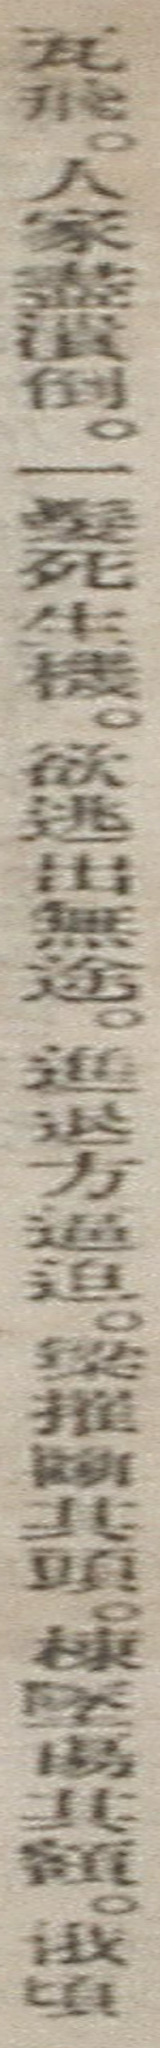瓦飛。人家盡潰倒。一髮死生機。欲逃出無途。進退方逼迫。梁摧断其頭。棟墜傷其額。俄頃
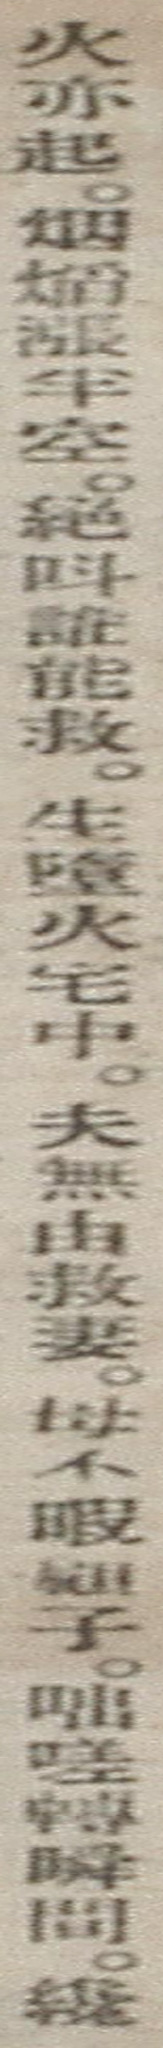火亦起。煙焔漲半空。絶叫誰能救。生堕火宅中。夫無由救妻。母不暇顧子。咄嗟転瞬間。纔
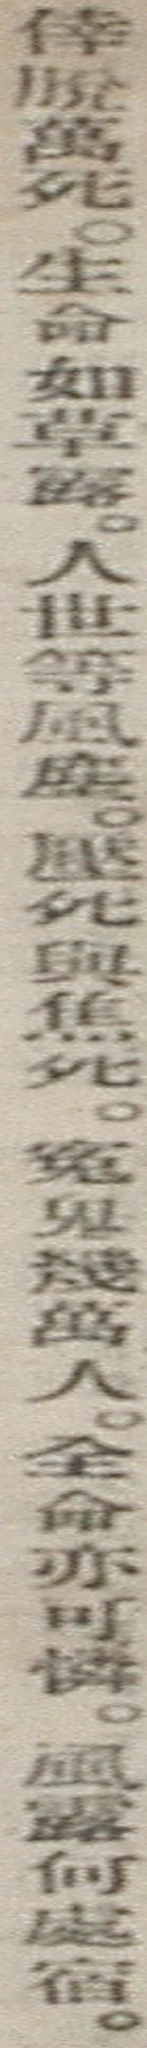倖脱萬死。生命如草露。人世等風塵。圧死與焦死。冤鬼幾萬人。全命亦可憐。風露何処宿。
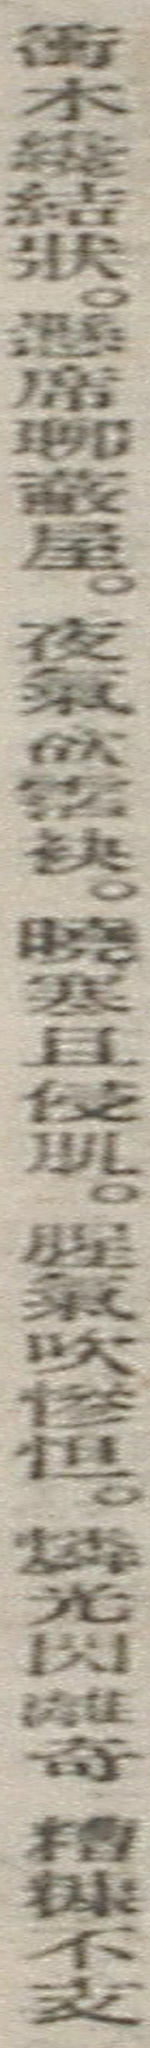衝木纔結状。懸席聊蔽屋。夜気欲霑袂。暁寒且浸肌。腥気吹惨怛。燐光閃離奇糟糠不支
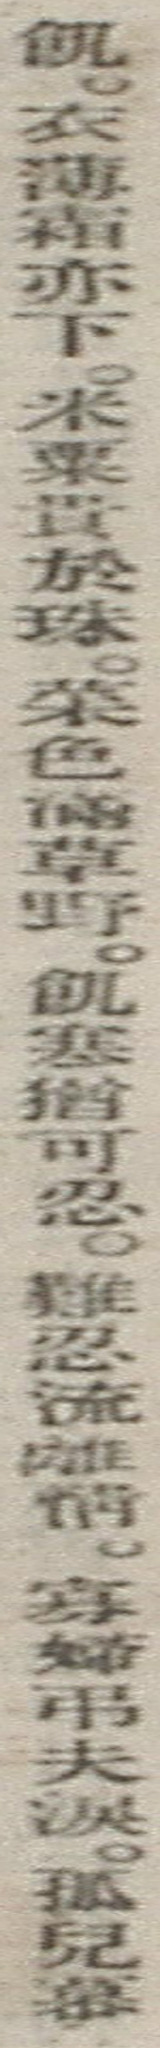飢。衣薄霜亦下。米粟貴於珠。菜色満草野。飢寒猶可忍。難忍流離情。寡婦弔夫涙。孤児慕
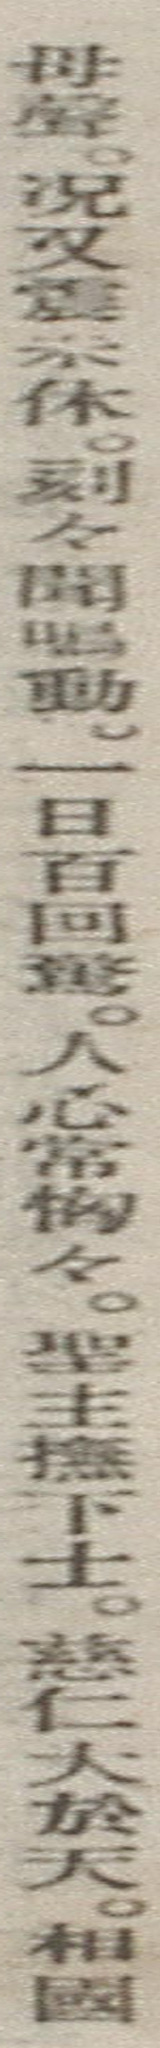母声。況又震未休。刻々聞鳴動。一日百回驚。人心常恟々。聖主撫下士。慈仁大於天。相国
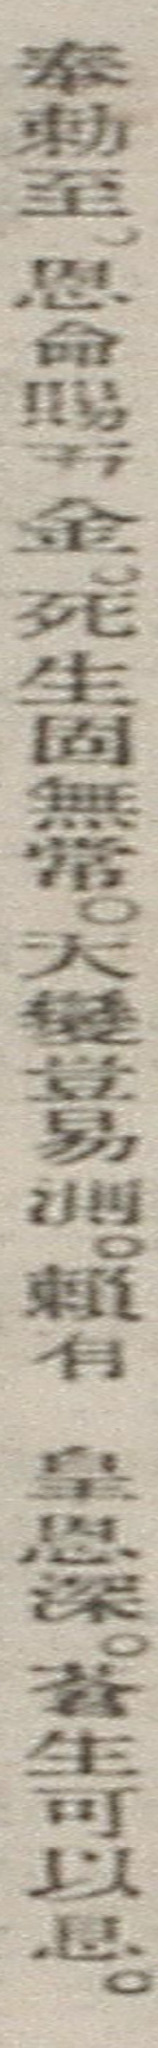奉敕至。恩命賜万金。死生固無常。天変豈易測。頼有皇恩深。蒼生可以息。
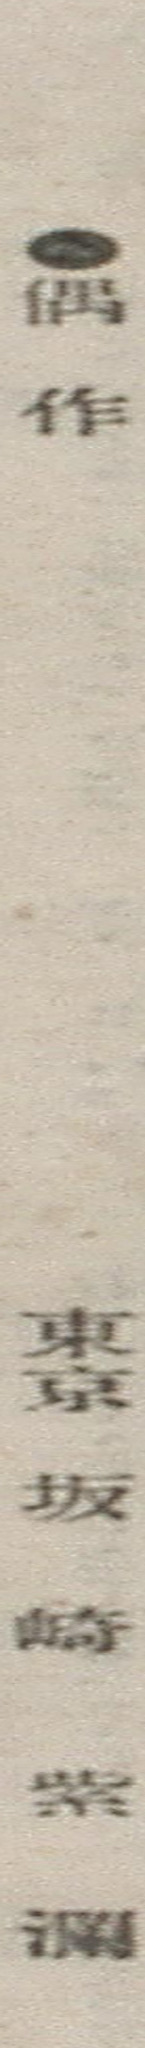●偶作東京坂崎紫瀾
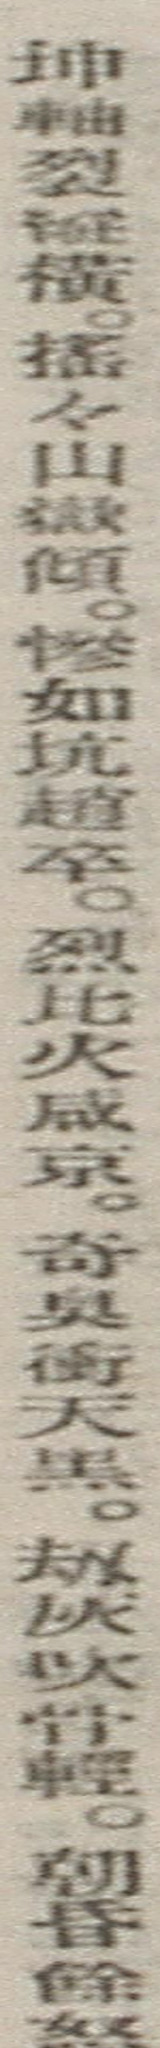坤軸裂縦横。揺々山嶽傾。惨如坑趙卒。烈比火咸京。奇臭衝天黒。刼灰吹骨軽。朝昏餘怒
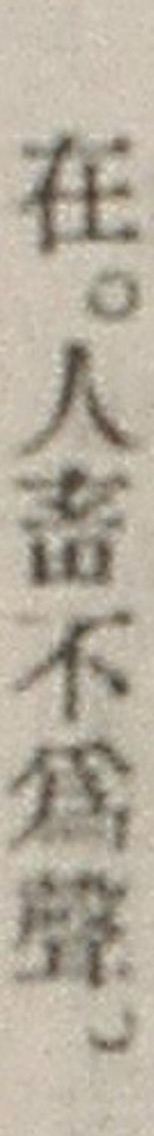在。人畜不為声。

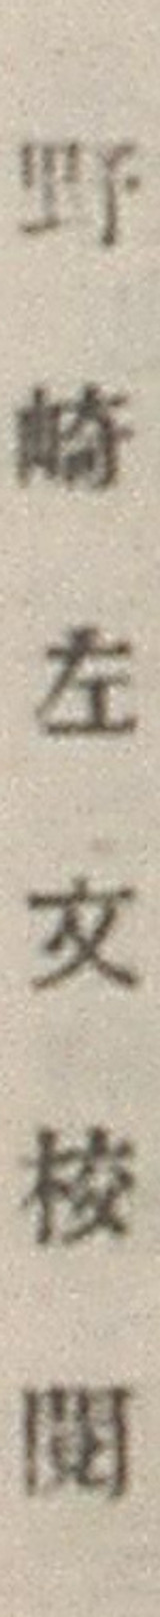野崎左文校閲
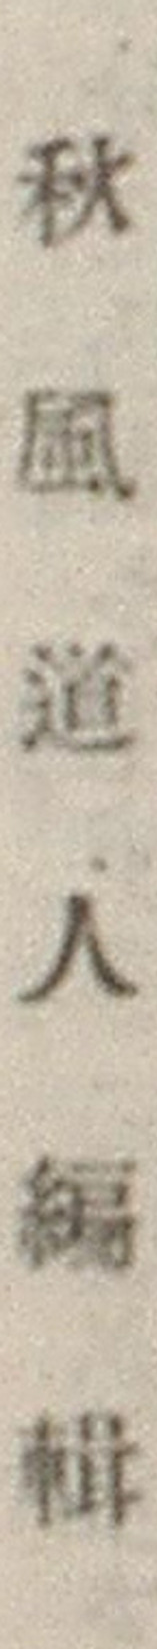秋風道人編輯
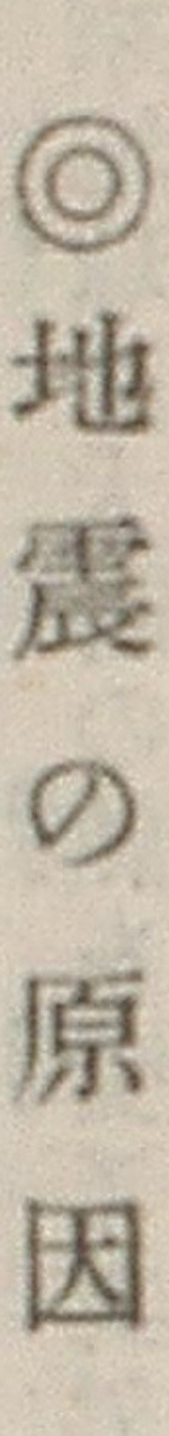◎地震の原因
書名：愛知岐阜福井三県　大地震見聞録（内題）
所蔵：東京大学地震研究所図書室 Earthquake Research Institute Library, The University of Tokyo, JAPAN
